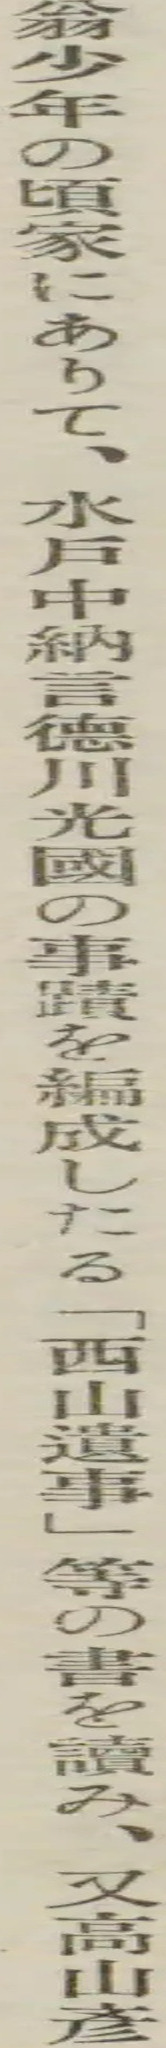翁少年の頃家にありて、水戸中納言徳川光國の事蹟を編成したる「西山遺事」等の書を読み、又高山彦
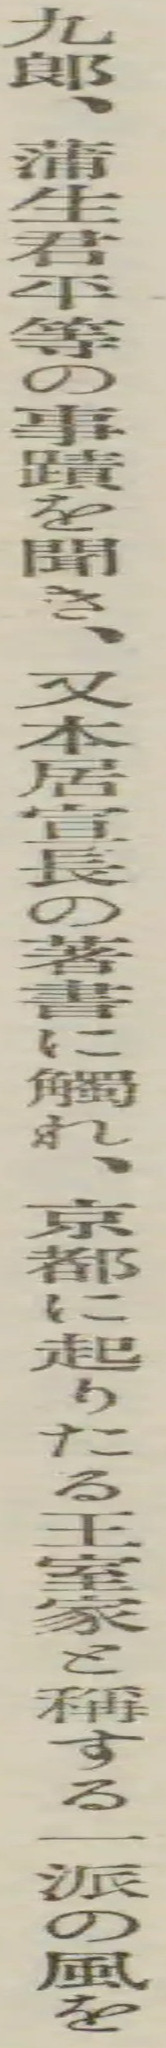九郎、蒲生君平等の事蹟を聞き、又本居宣長の著書に触れ、京都に起りたる王室家と称する一派の風を
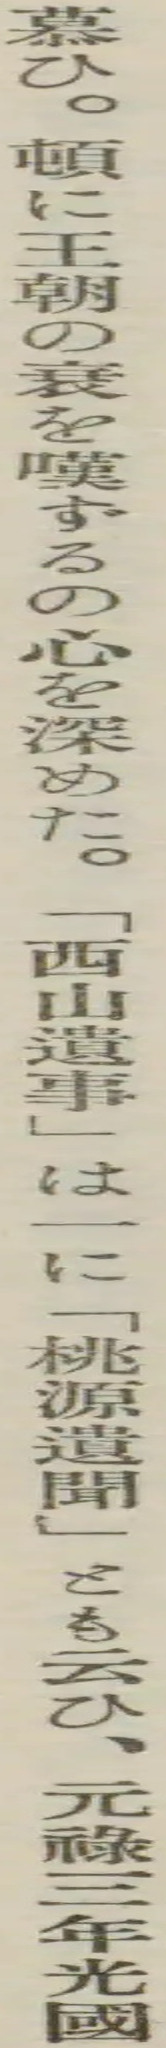慕ひ。頓に王朝の衰を嘆ずるの心を深めた。「西山遺事」は一に「桃源遺聞」とも云ひ、元禄三年光國
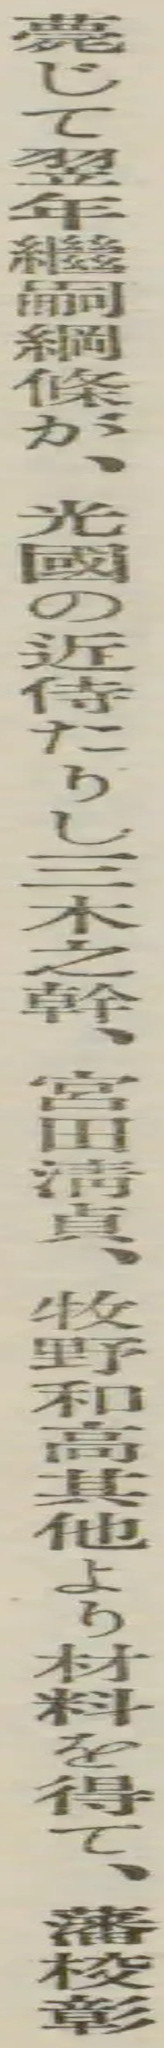薨じて翌年継嗣綱條が、光國の近侍たりし三木之幹、宮田清貞、牧野和高其他より材料を得て、藩校彰
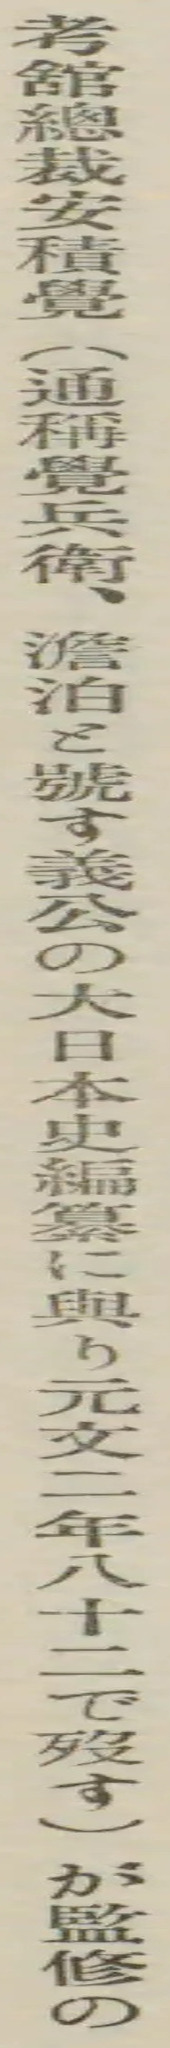考館総裁安積覺(通称覺兵衛、澹泊と号す義公の大日本史編纂に与り元文二年八十二で歿す)が監修の
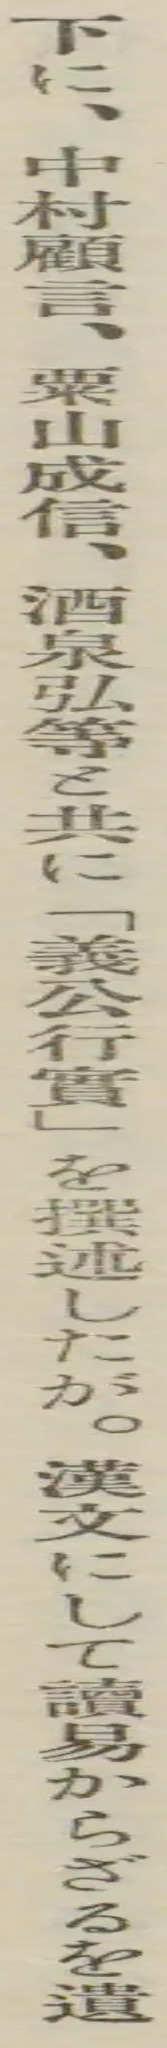下に、中村顧言、粟山成信、酒泉弘等と共に「義公行實」を撰述したが。漢文にして読易からざるを遺

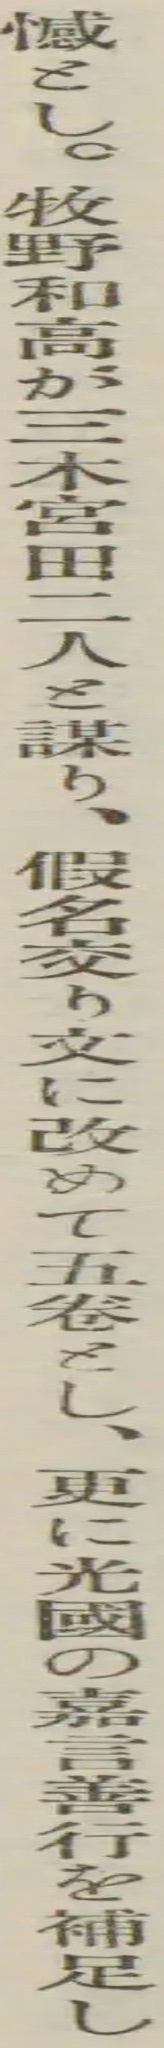憾とし。牧野和高が三木宮田二人と謀り、仮名混り文に改めて五巻とし、更に光國の嘉言善行を補足し
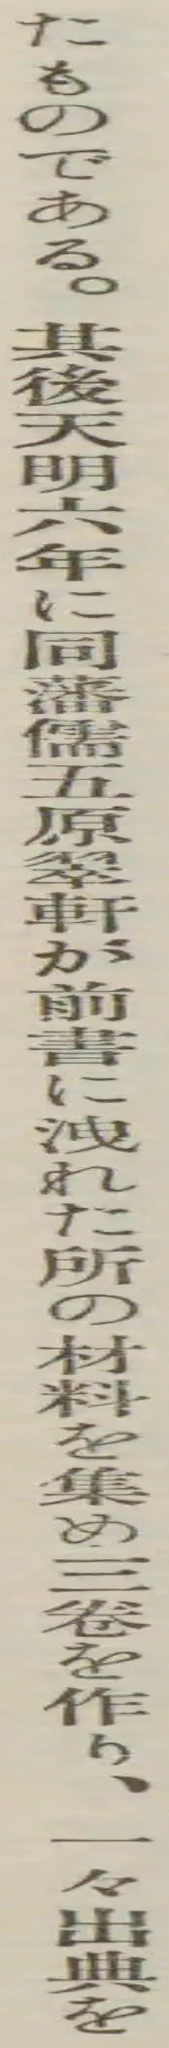たものである。其後天明六年に同藩儒五原翠軒が前書に漏れた所の材料を集め三巻を作り、一々出典を
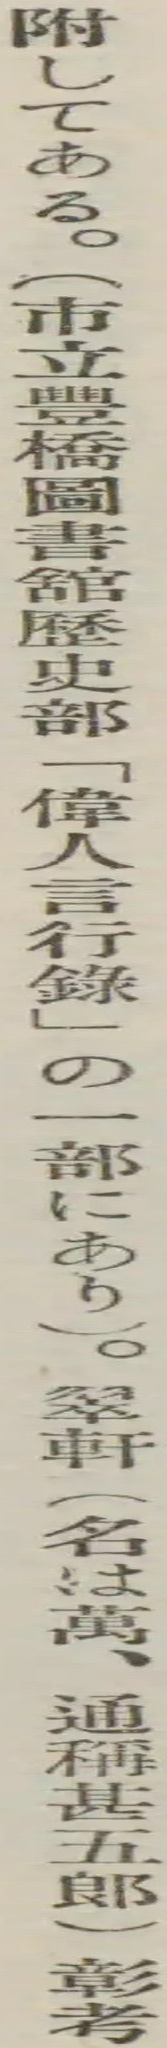附してある。(市立豊橋図書館歴史部「偉人言行録」の一部にあり)。翠軒(名は萬、通称甚五郎)彰考
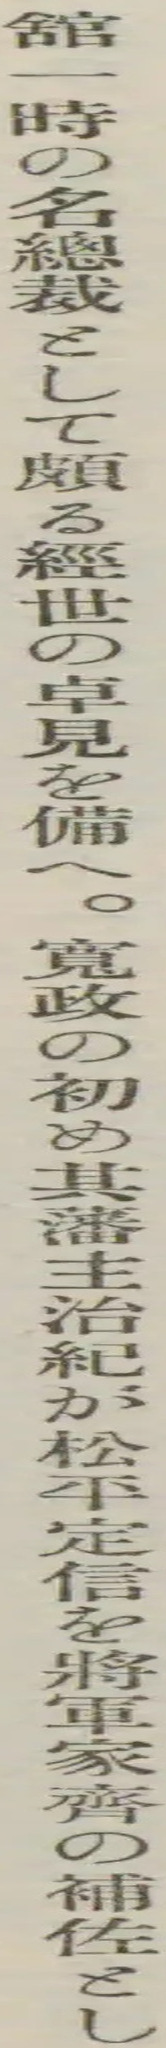館一時の名総裁として頗る経世の卓見を備へ。寛政の初め其藩主治紀が松平定信を将軍家齊の補佐とし
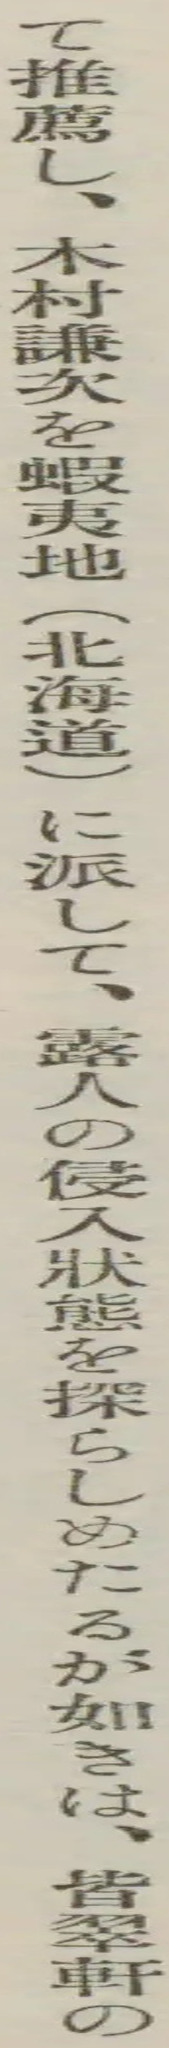て推薦し、木村謙次を蝦夷地(北海道)に派して、露人の侵入状態を探らしめたるが如きは、皆翠軒の
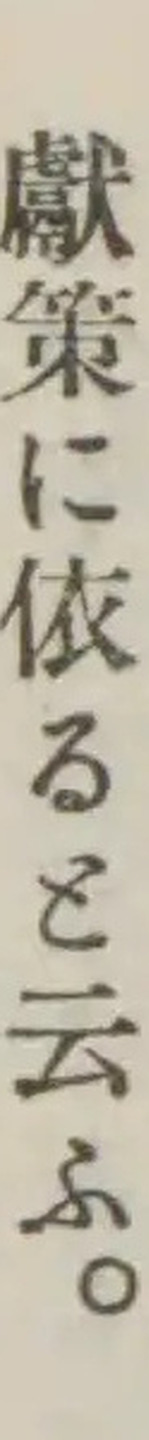献策に依ると云ふ。
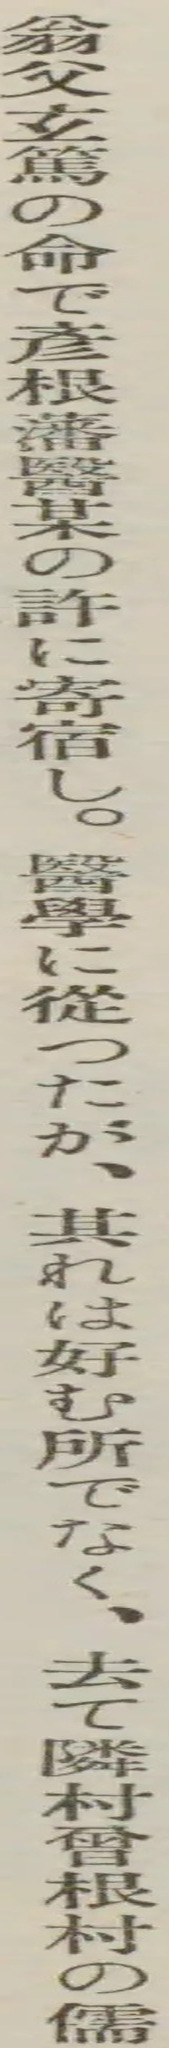翁父玄篤の命で彦根藩医某の許に寄宿し。医学に従つたが、其れは好む所でなく、去て隣村曽根村の儒
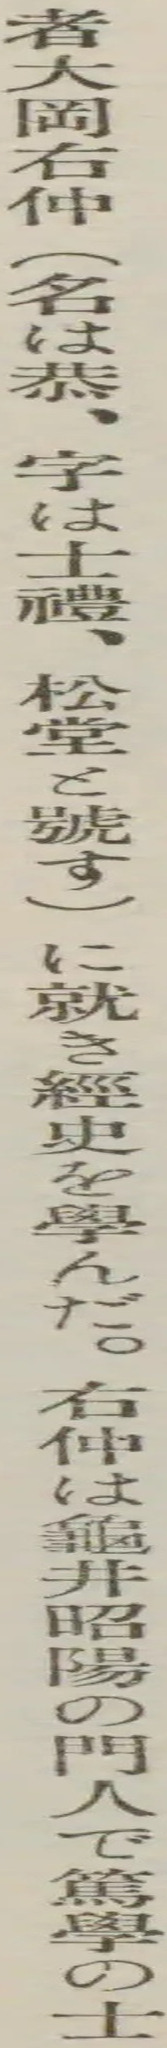者大岡右仲(名は恭、字は士禮、松堂と号す)に就き経史を学んだ。右仲は龜井昭陽の門人で篤学の士
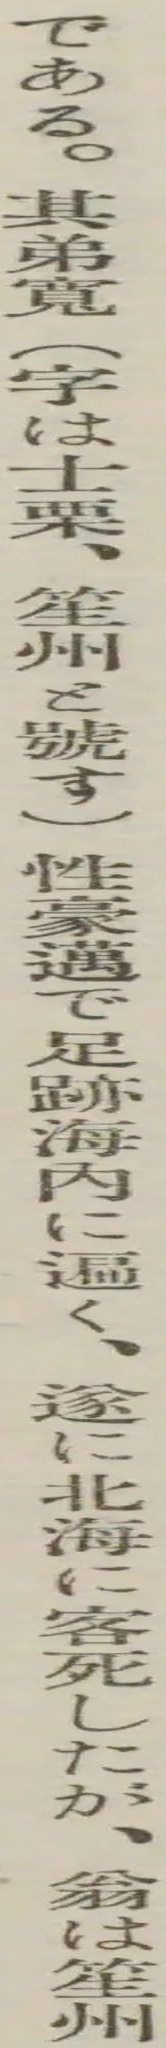である。其弟寛(字は士栗、笙州と号す)性豪邁で足跡海内に遍く、遂に北海に客死したが、翁は笙州
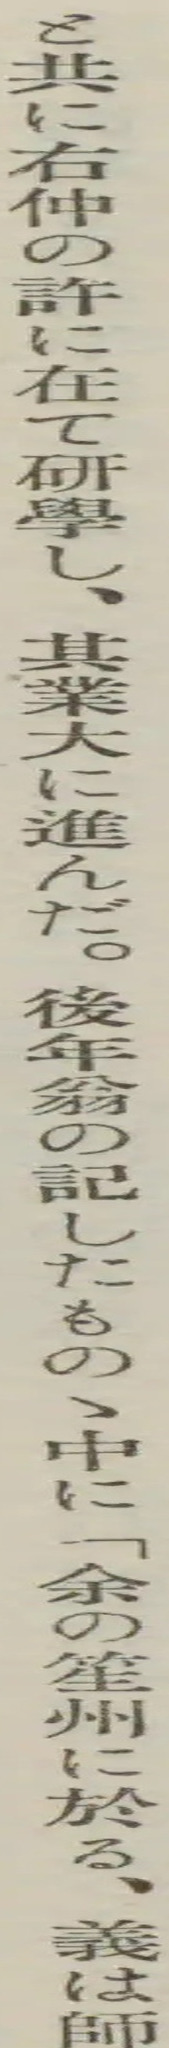と共に右仲の許に在て研学し、其業大に進んだ。後年翁の記したものゝ中に「余の笙州に於る、義は師
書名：小野湖山翁小伝
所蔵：国立国会図書館 National Diet Library, JAPAN
